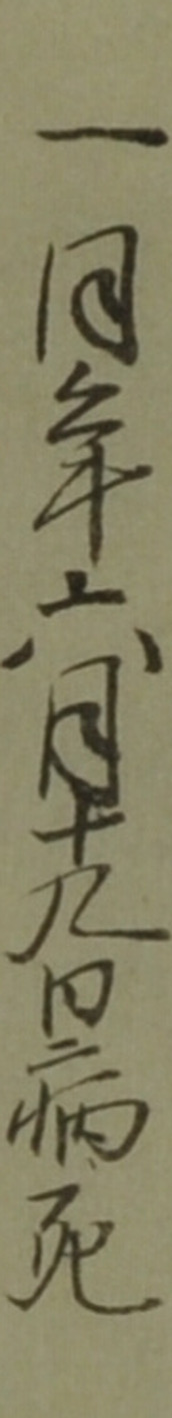一同年六月十九日病死
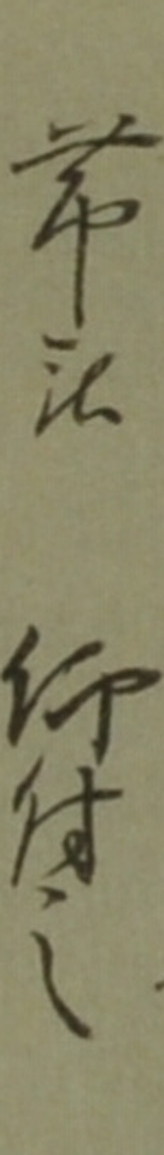帯被仰付之
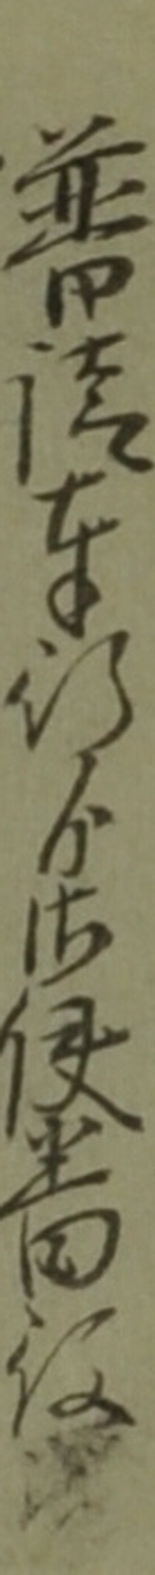普請奉行ゟ御使番役
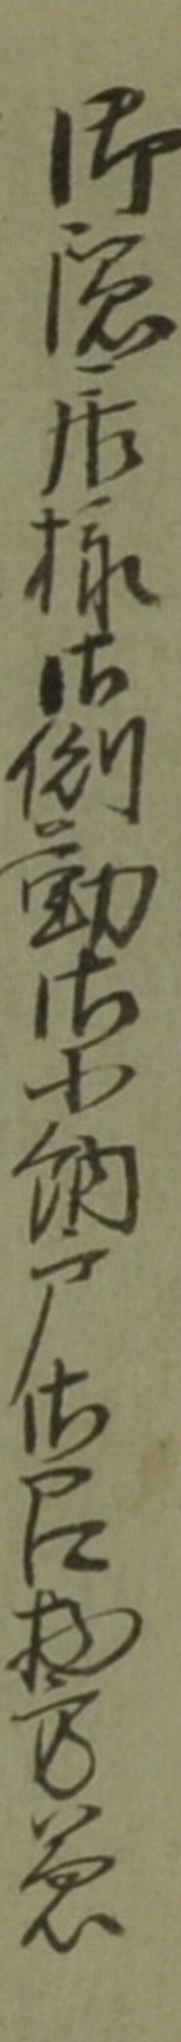御隠居様御側勤御小納戸御召物方兼
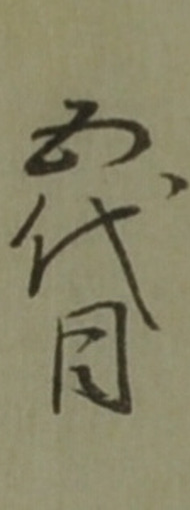五代目
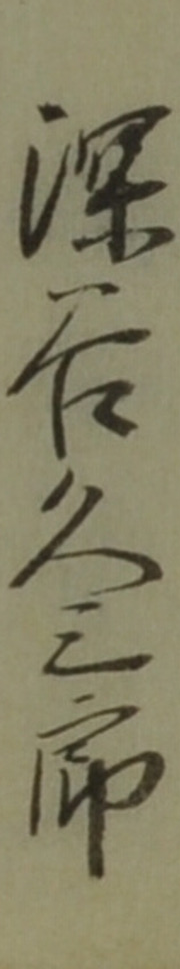深谷久三郎
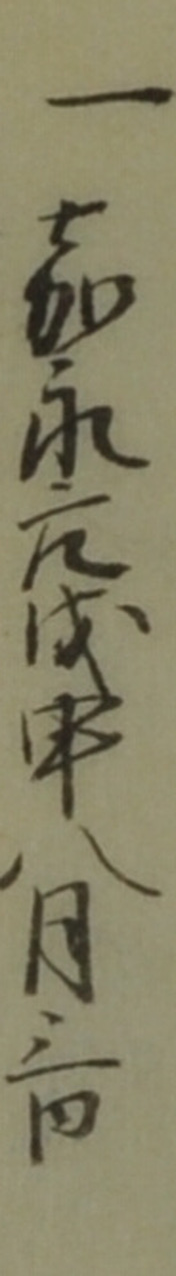一嘉永元戊申八月三日
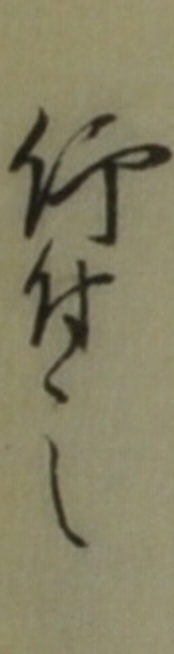仰付之
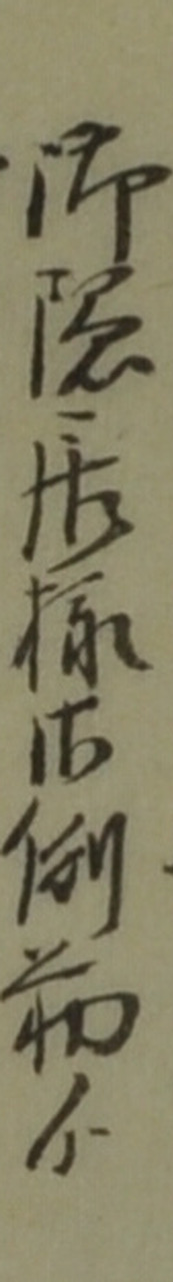御隠居様御側勤ゟ
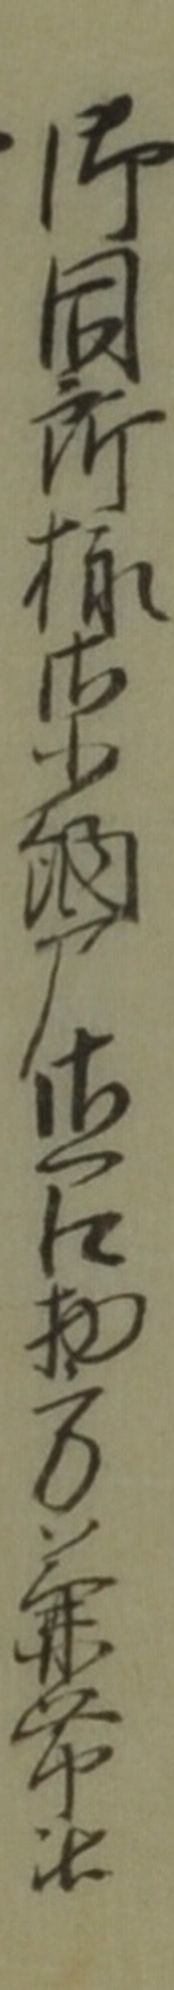御同所様御小納戸御召物方兼帯被
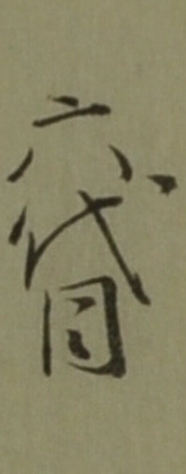六代目
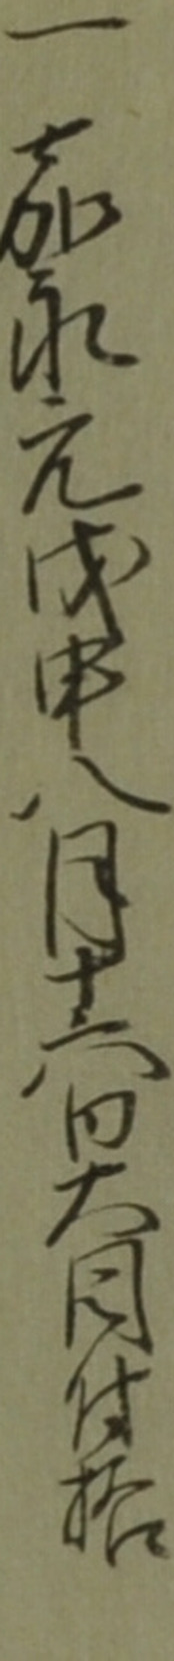一嘉永元戊申八月十六日大目付格
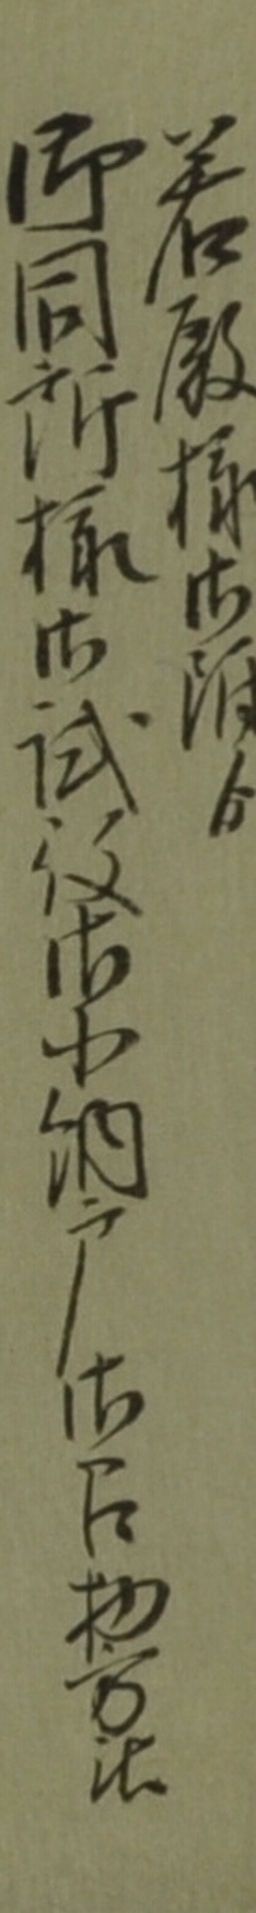御同所様御試役御小納戸御召物方被
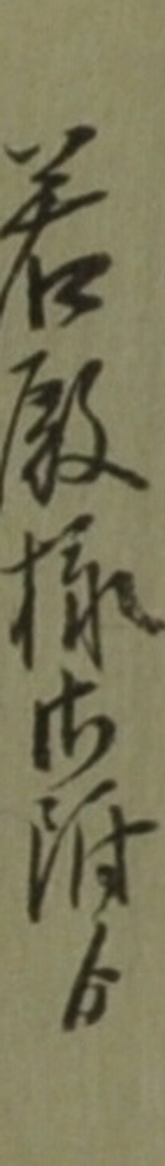若殿様御附ゟ
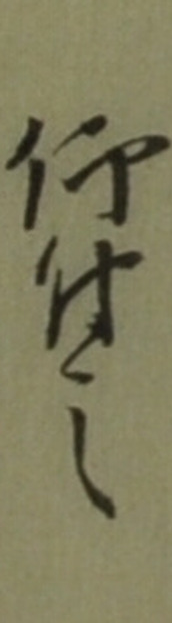仰付之

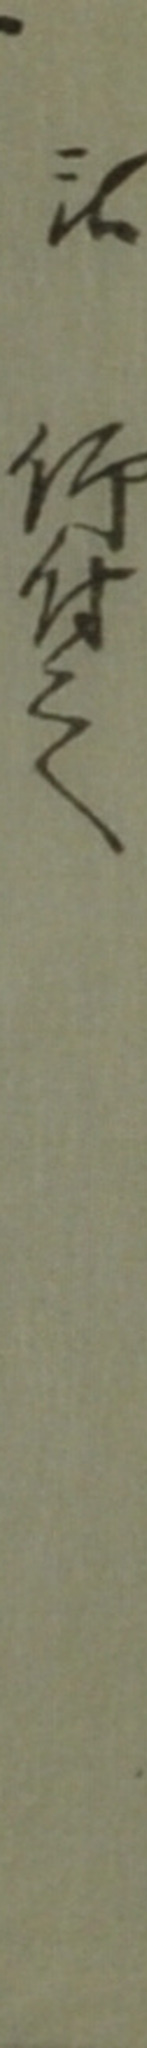被仰付之
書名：諸御役代々録（四）
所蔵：伊那市立高遠町図書館・合同会社AMANE
